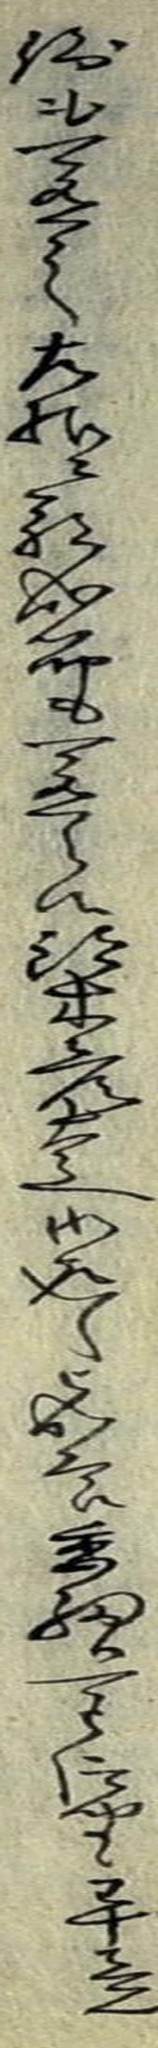儀も可有之左様ニ難成筋も可有之候鈴木彦大夫御返し被成節委細ハ可被仰聞候畢竟
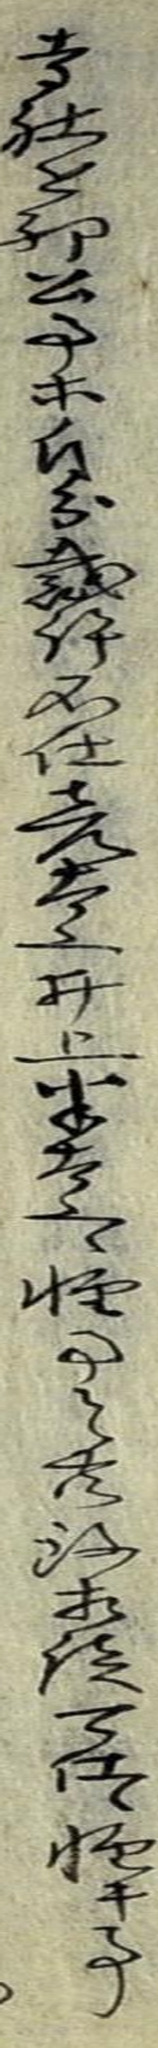寺社を初公事等自分裁許不仕彦大夫井上半大夫へ軽事ニ候共致相談可仕候軽キ事
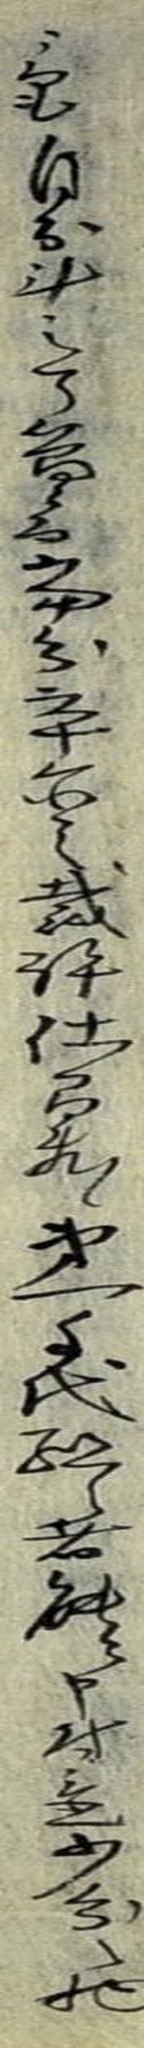ニ而も自分斗之了簡ニ而当分卒爾之裁許仕間敷候第一手代組之者能々申付置少分之物
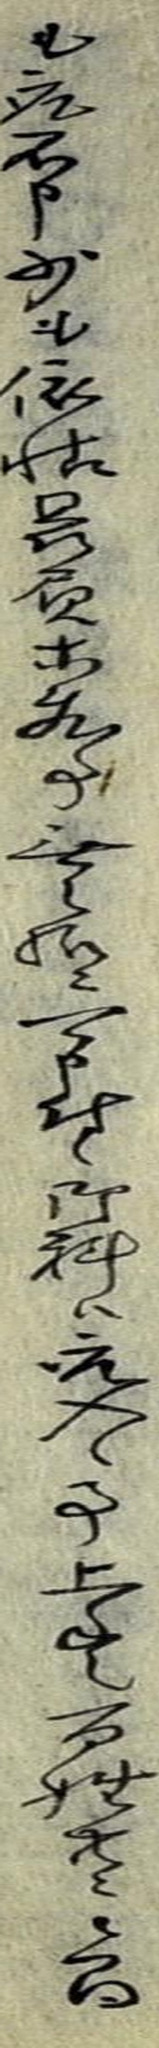も取不申少も依怙贔屓等敷事無之様ニ可申付候御料ハ取入候事上手之百姓共ニ候間
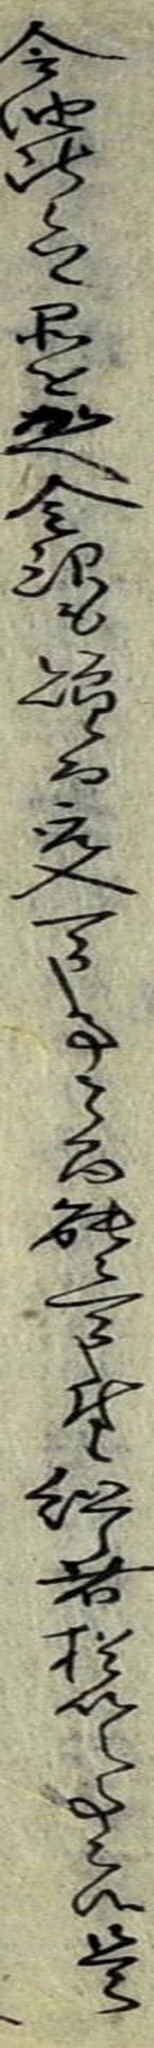令油断候ハヽ品をかへ金銀も贈候而取入可申事ニ候間能々可申付候組之者猶以之事ニ候是
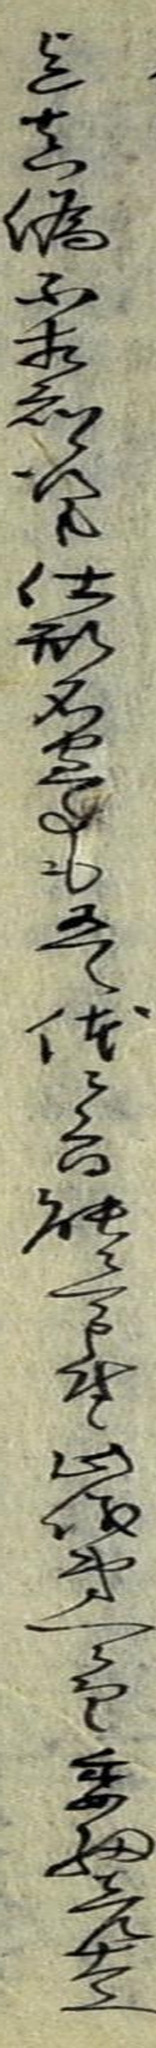迄真偽不相知候得共仕形不宜事も有之体ニ候間能々可申付候此儀第一ニ而候委細彦大夫
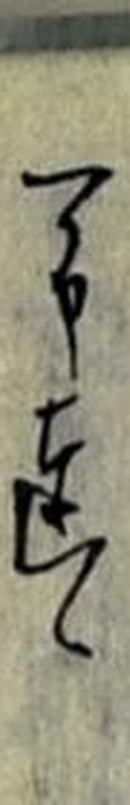可申達候
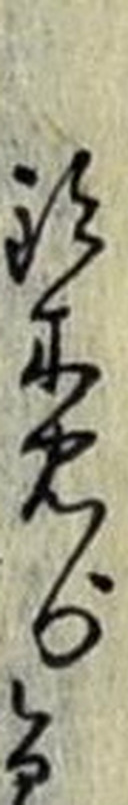鈴木忠右衛門
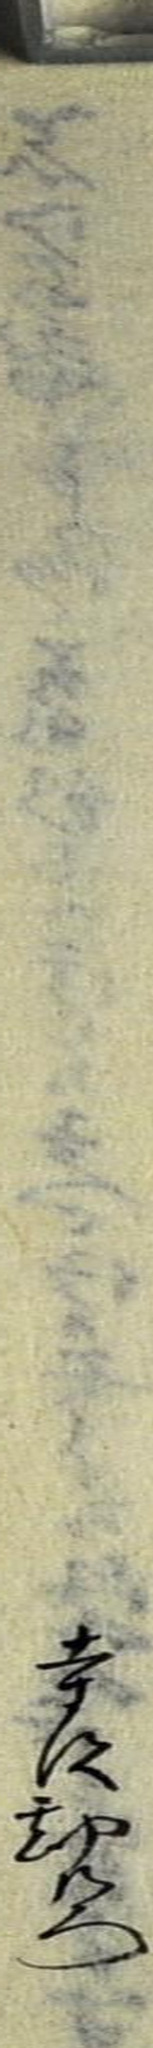寺沢勘左衛門
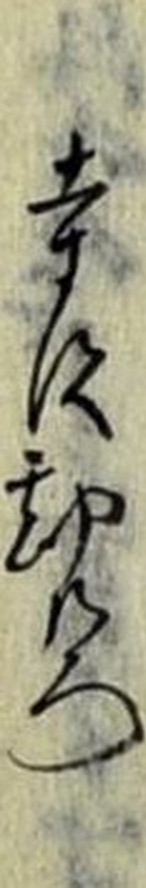寺沢勘左衛門
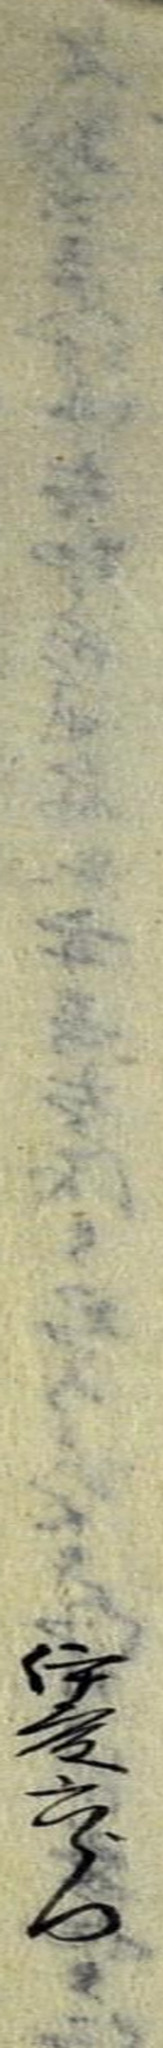伊藤六郎右衛門
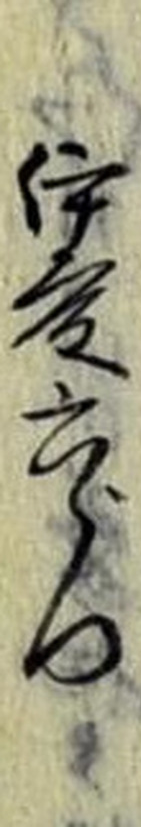伊藤六郎右衛門
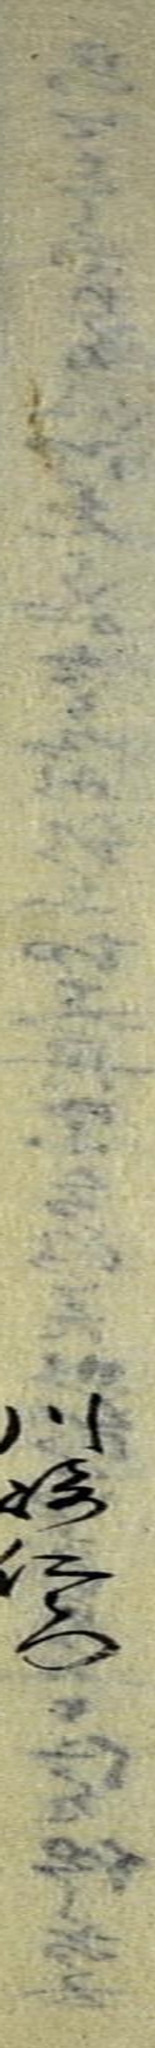川崎仁右衛門
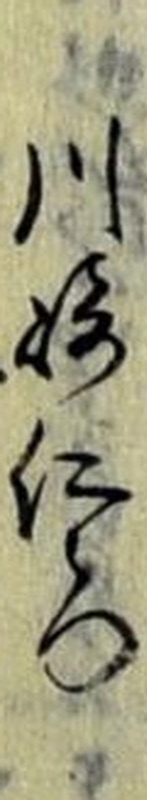川崎仁右衛門
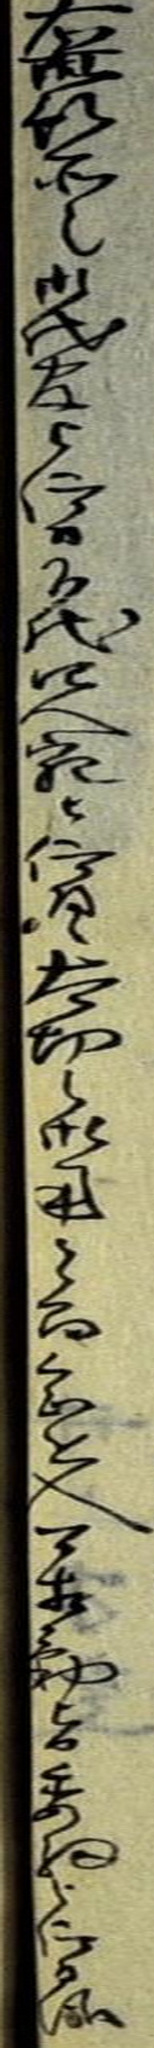右御預所之御代官被仰付下代四人宛被仰付候太切之御用ニ候間念を入可相勤旨委細被仰付候
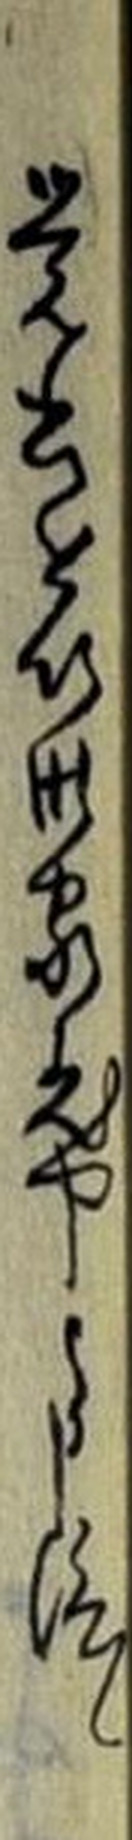覚書を以御家老中被申渡候
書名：命令之部 一
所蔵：福井県文書館 Fukui Prefectural Archives
